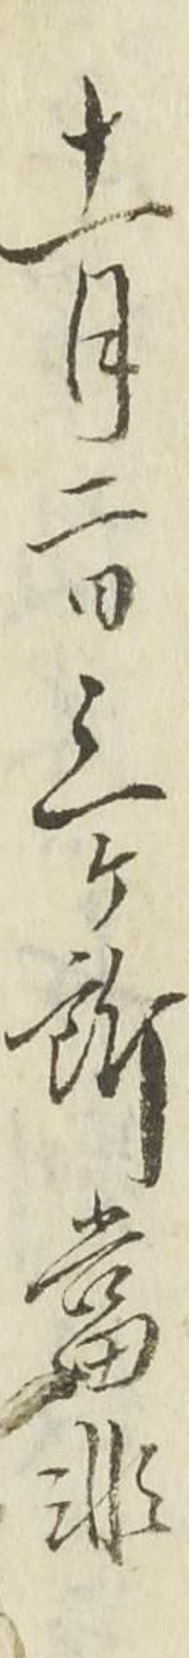十一月二日三ヶ所当非
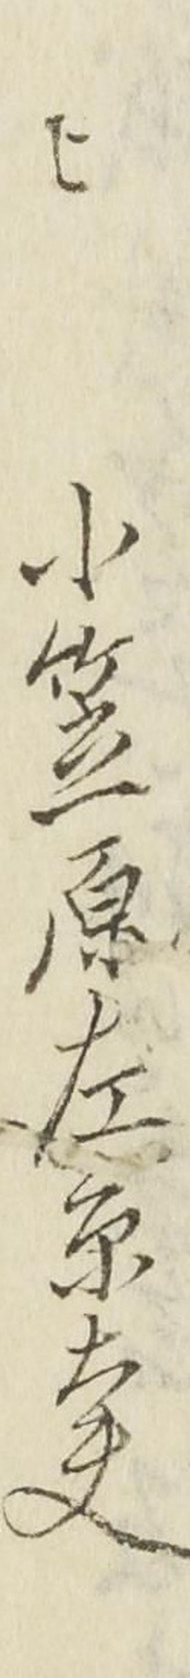ヒ小笠原左京大夫
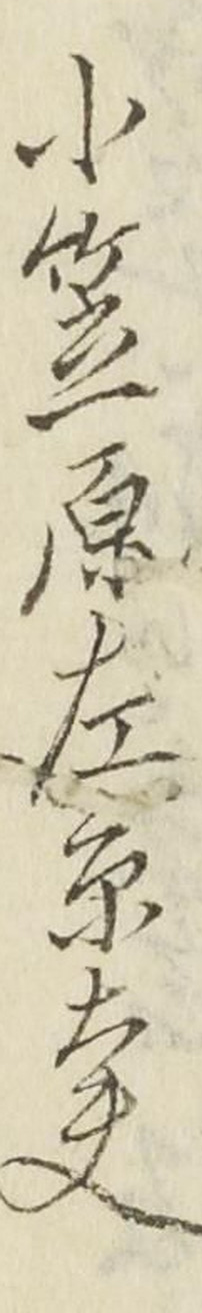ヒ小笠原左京大夫
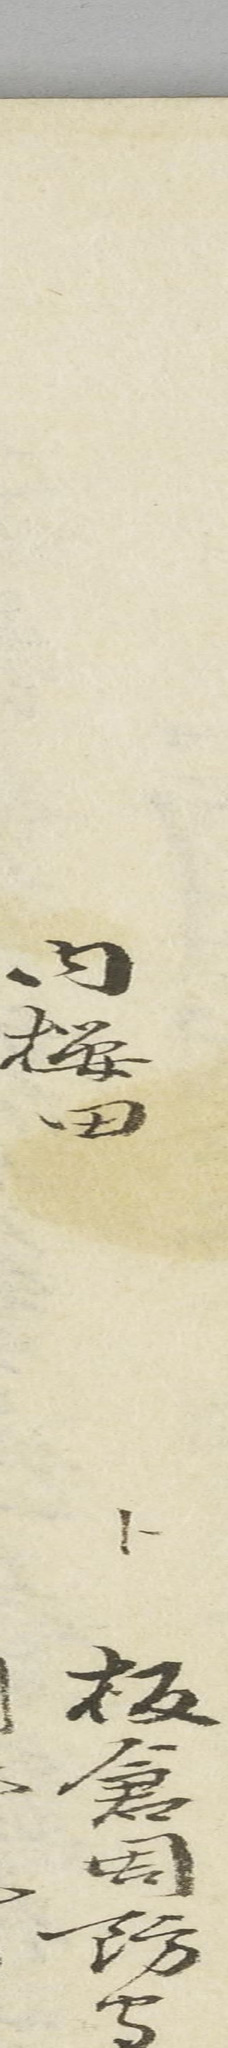内桜田ト板倉周防守
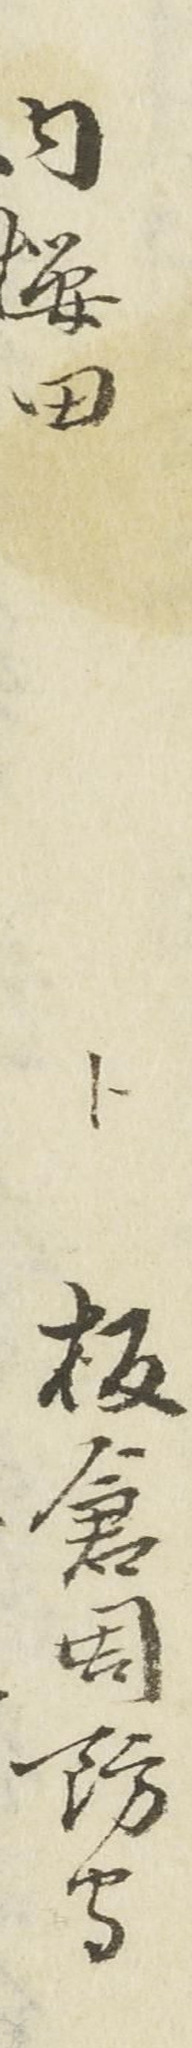内桜田ト板倉周防守
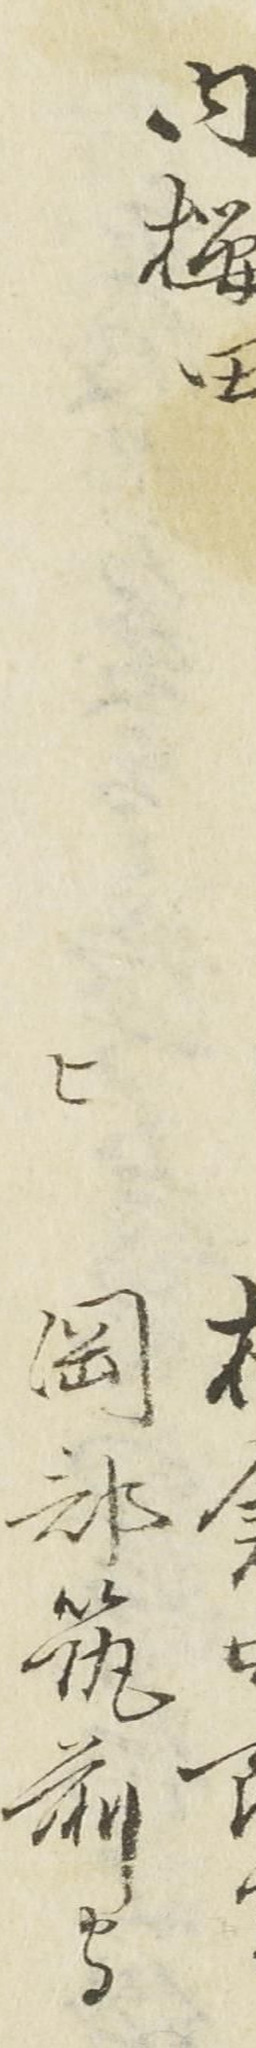ヒ岡部筑前守
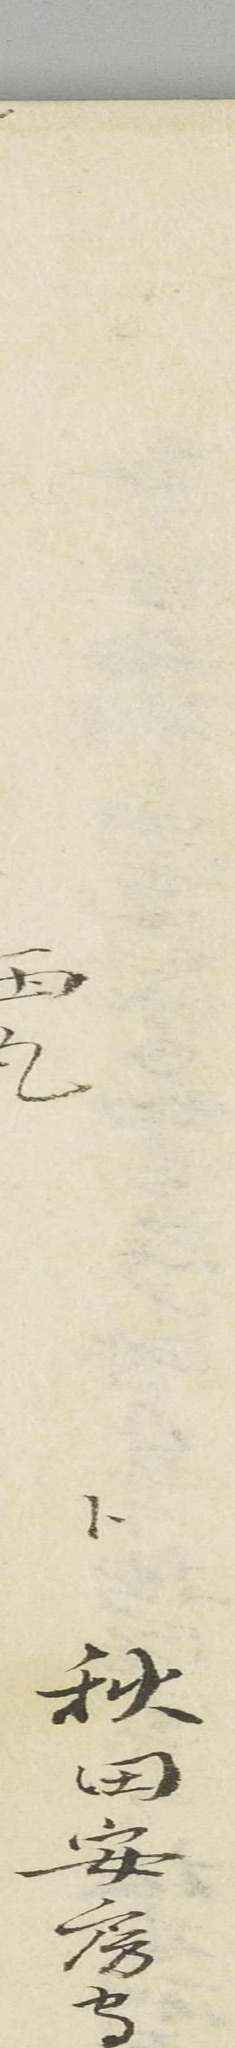西丸ト秋田安房守
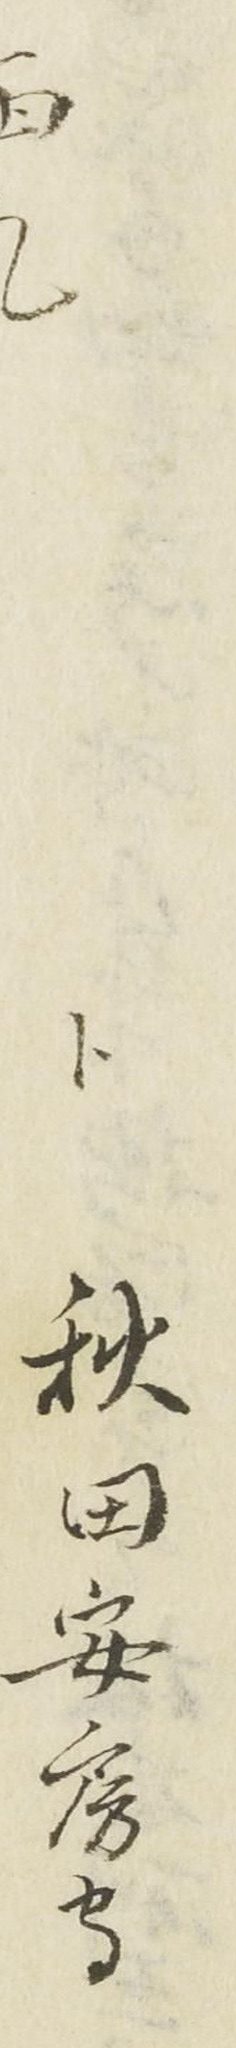西丸ト秋田安房守
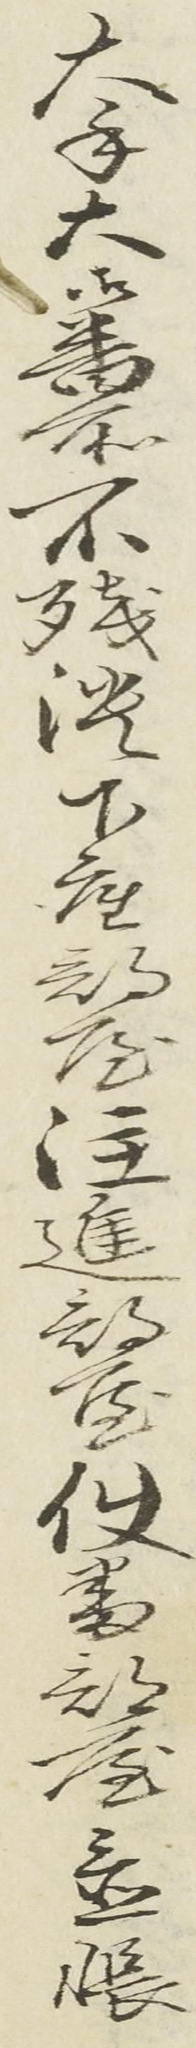大手大御番所不残潰下座部屋注進部屋使番部屋置帳
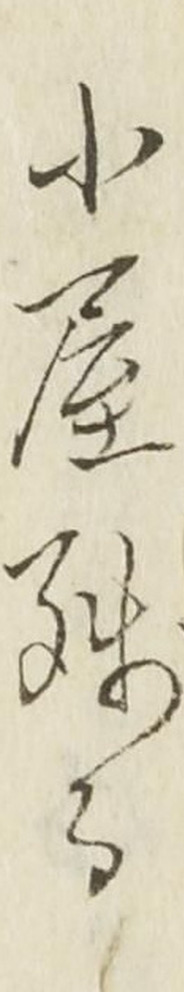小屋残る
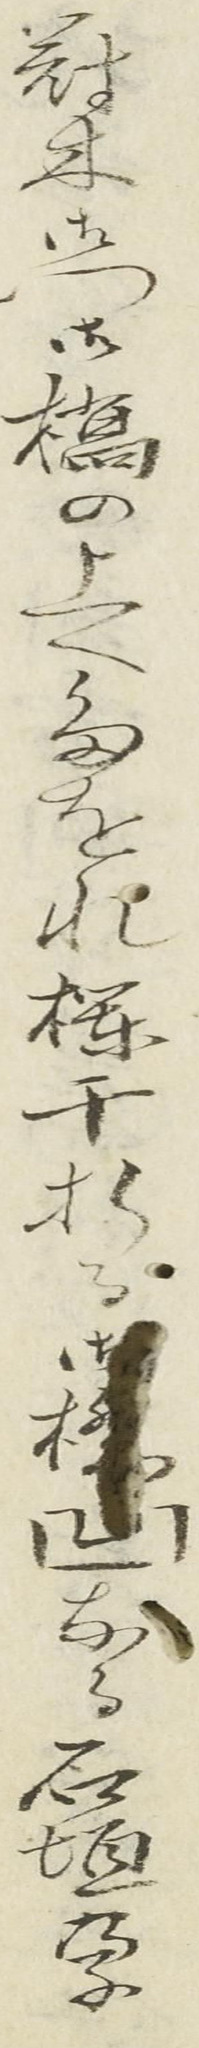冠木御門橋の上へたをれ欄干折る御橋凹なる石垣孕
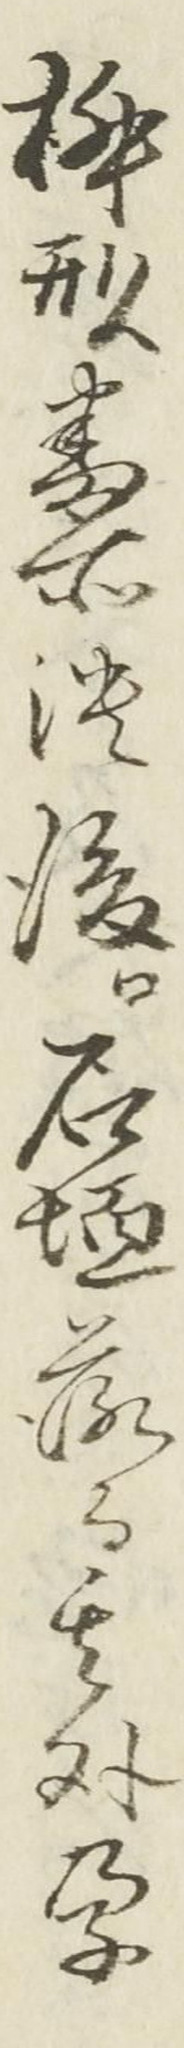枡形番所潰後ㇿ石垣落る其外孕
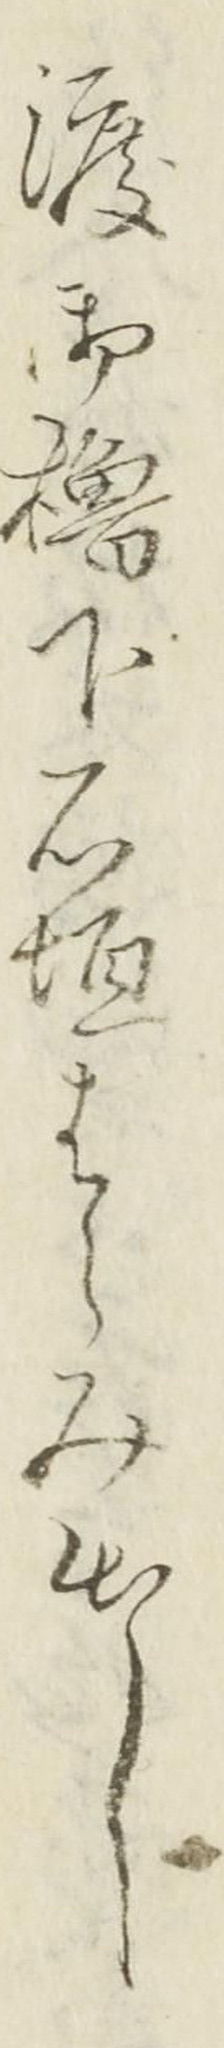渡御櫓下石垣はしみ出し
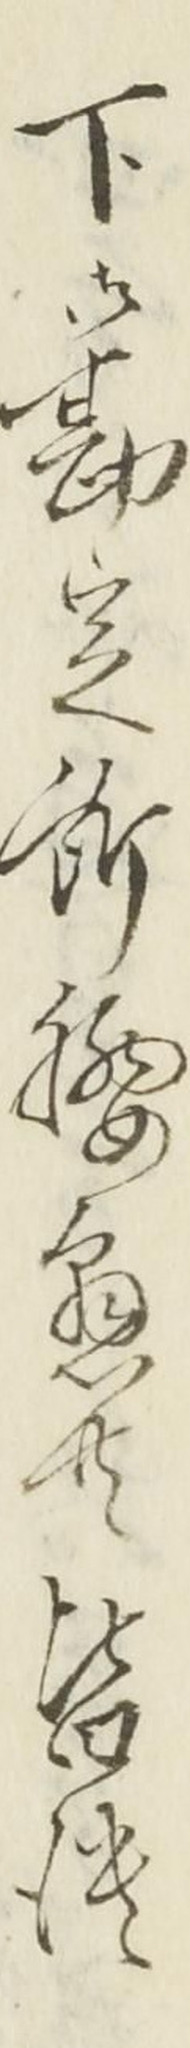下御勘定所腰懸共皆潰
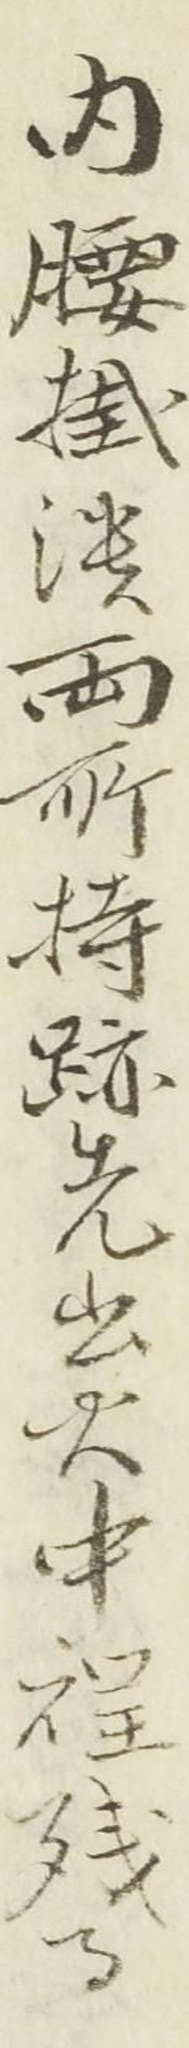内腰掛潰両所持跡先出火中程残る
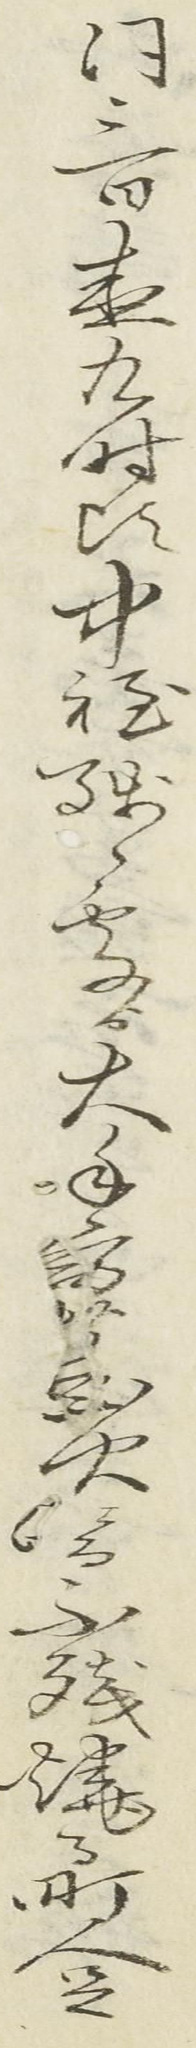同三日夜九時頃中程残候處ゟ大手方出火ニ而不残焼る町人足
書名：安政二乙卯年十月二日大地震之事
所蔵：東京大学地震研究所図書室 Earthquake Research Institute Library, The University of Tokyo, JAPAN
